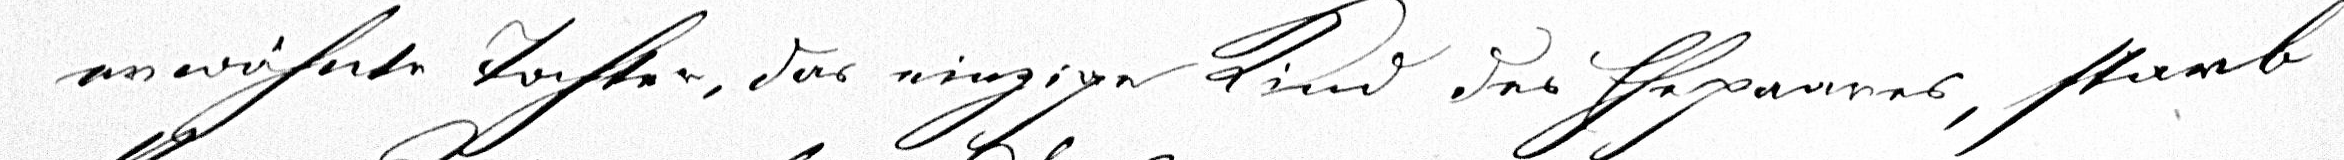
erwähnte Tochter, das einzige Kind des Ehepaares, starb
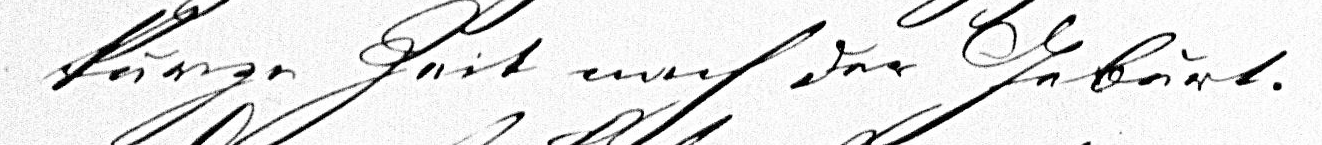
kurze Zeit nach der Gebart.
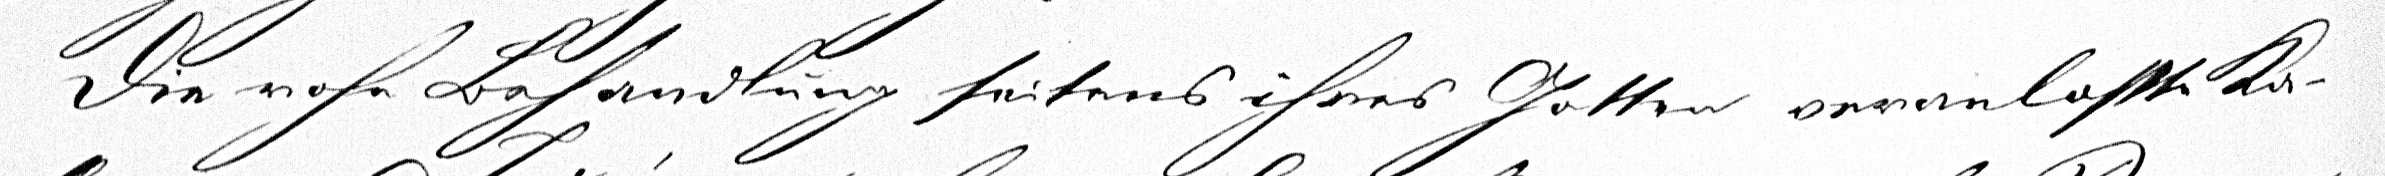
Die rohe Behandlung seitens ihres Gotten veranlosste Ka¬
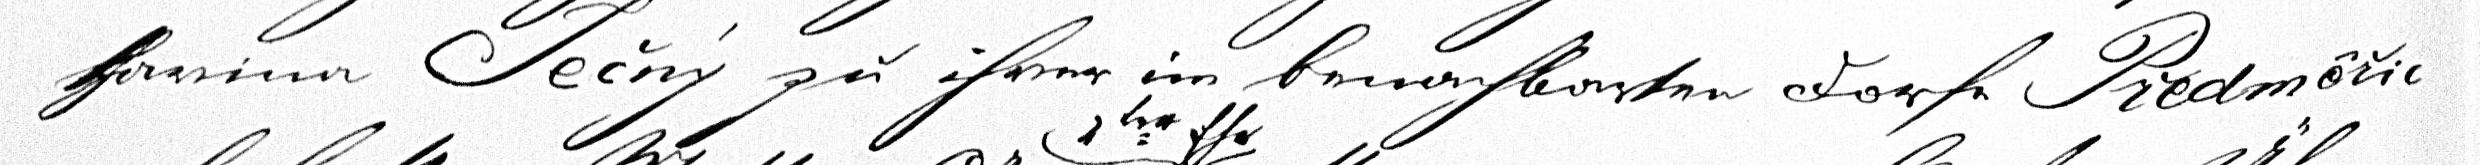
tarina Jecný zu ihrer im benachbarten Forse Predmoric
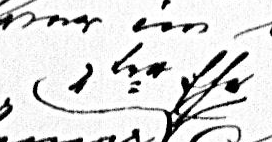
4ter
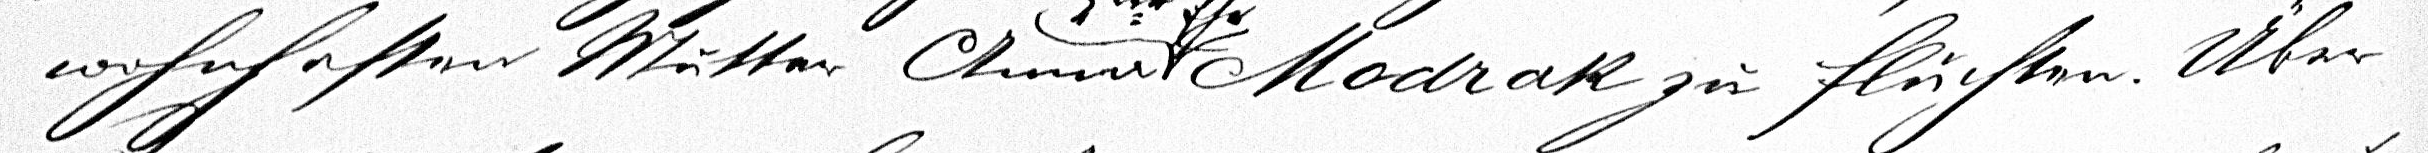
wohnhaften Mutter Anna Ehr Modrak zu fluchten. Über
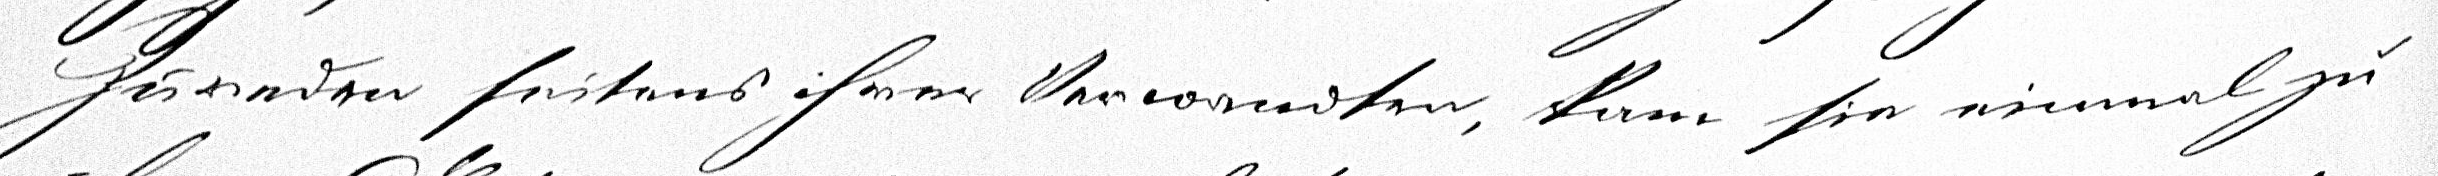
Gereden seitens ihrer Verwandten, kam sie einmal zu
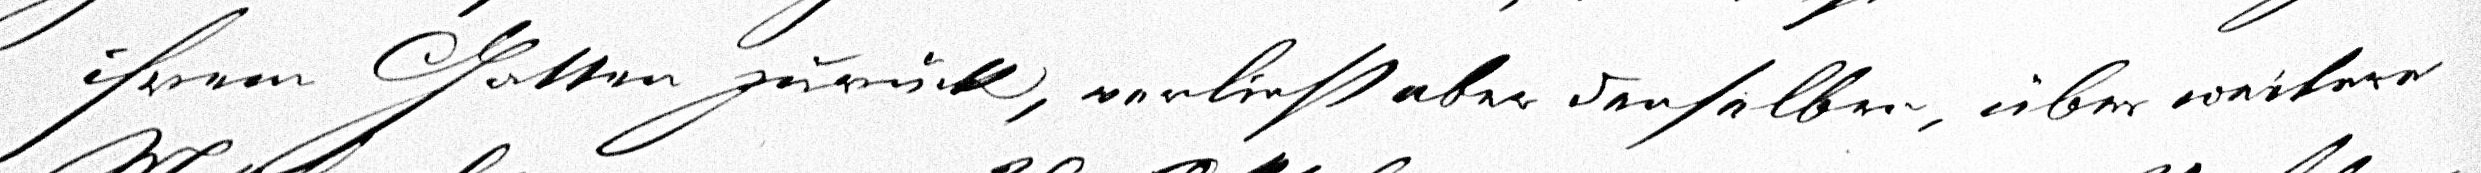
ihrem Gallen zurück, verließ aber derselben, über weitere
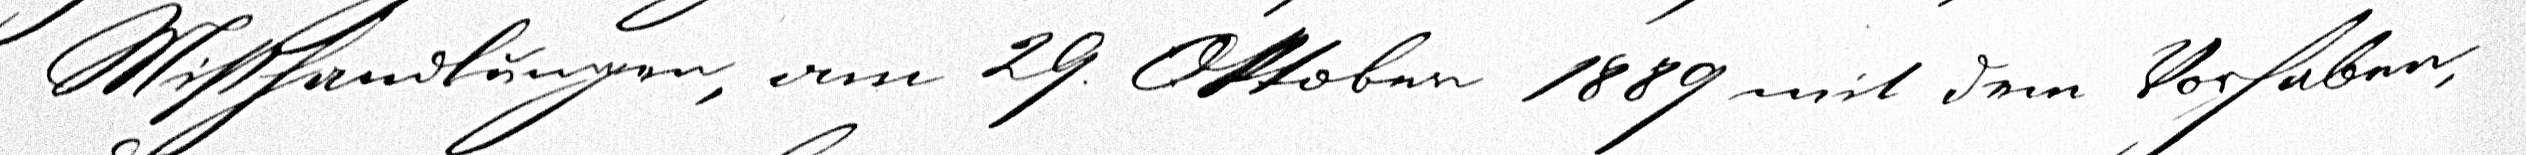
Misshandlungen, am 29. Oktober 1889 mit dem Vorhaben,
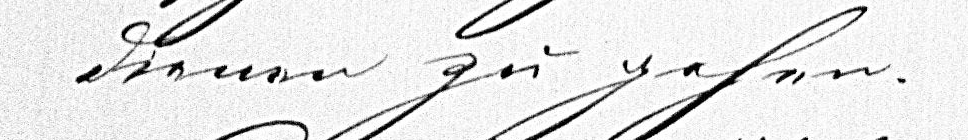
dienen zu gehen.
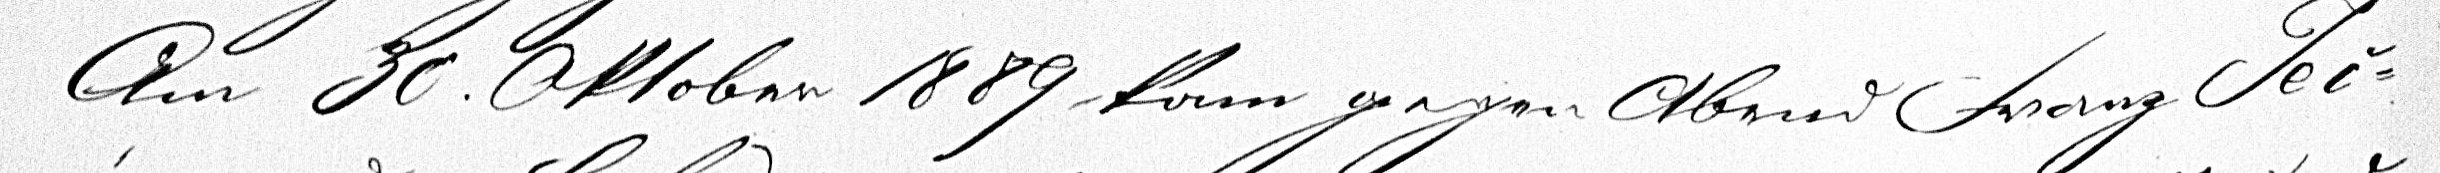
Am 30. Oktober 1889 kam gegen Abend Franz Jec¬
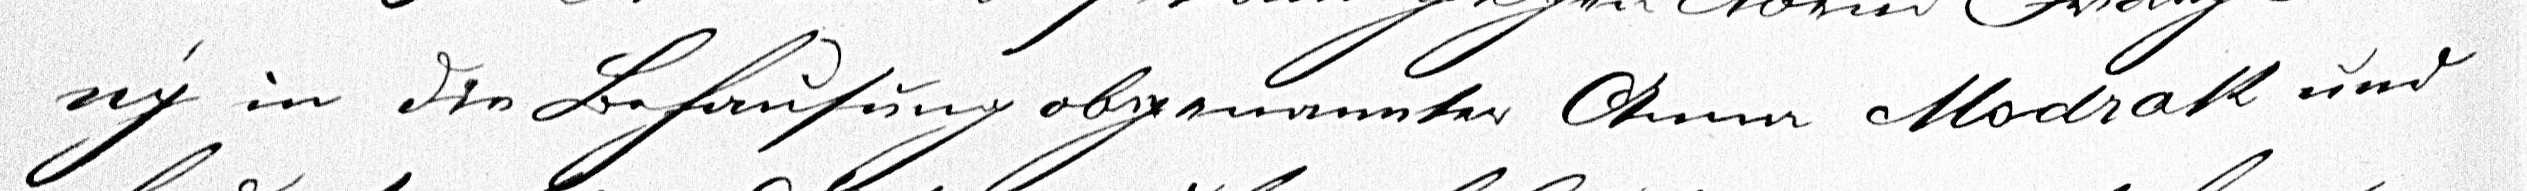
ný in die Behausung obgenannter Anna Modrak und
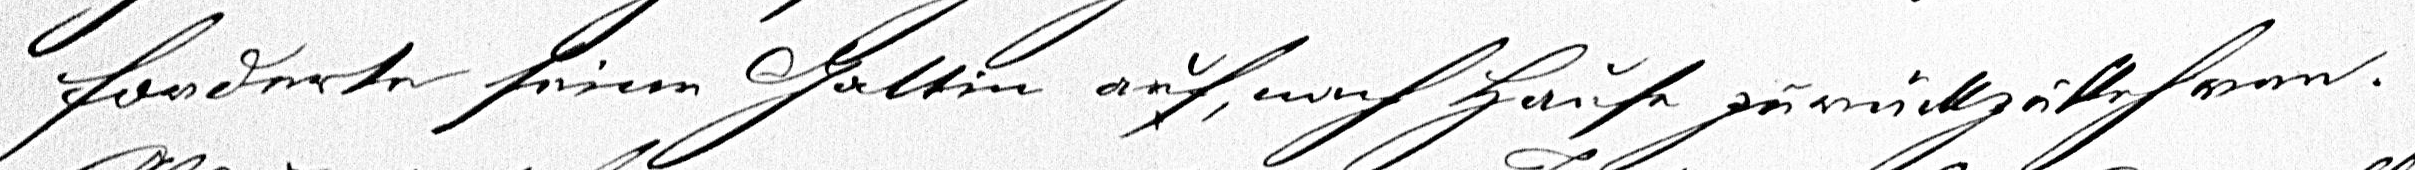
forderte seine Gattin auf, nach Hause zurückzättefran.
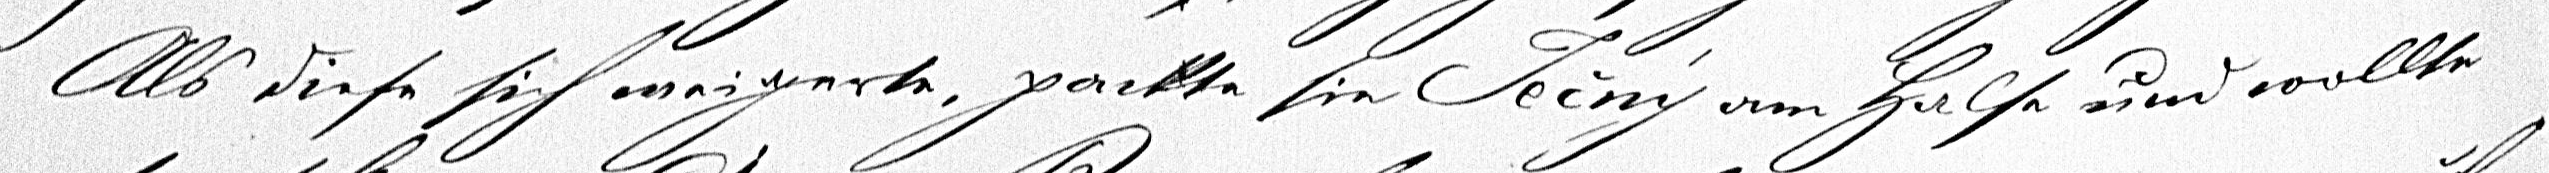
Als diese sich weigerte, parkte sie Jecný am Halse und wollte
